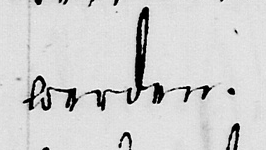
werden.
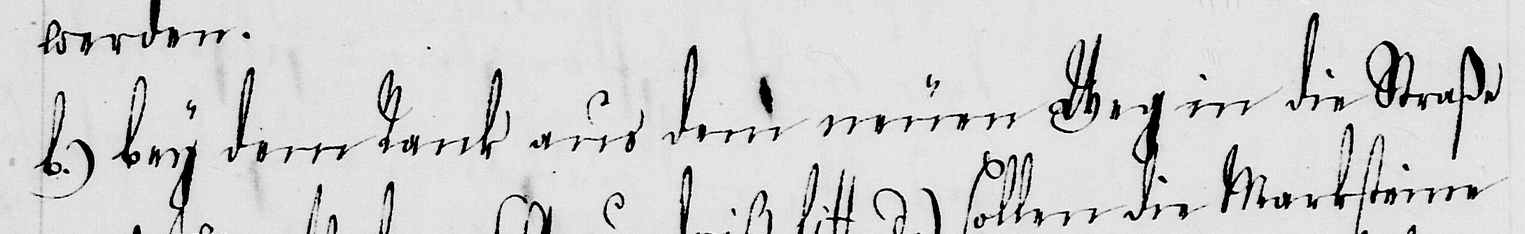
b.) bey dem Rank aus dem neuen Weg in die Straße
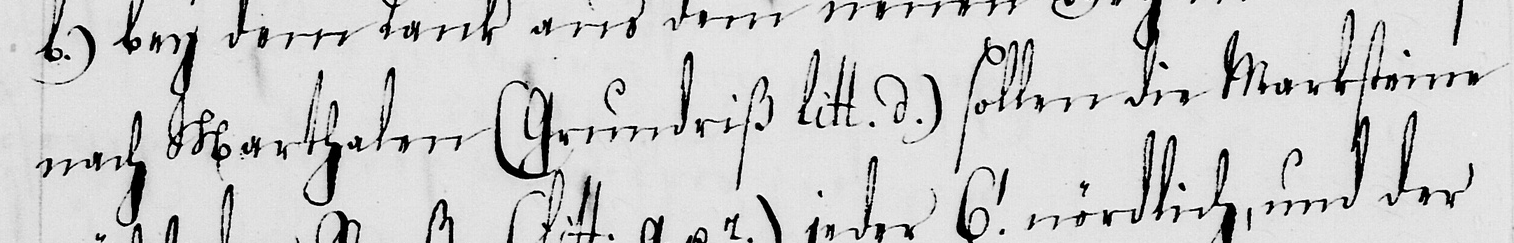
nach Marthalen (Grundriß litt. d.) sollen die Marksteine
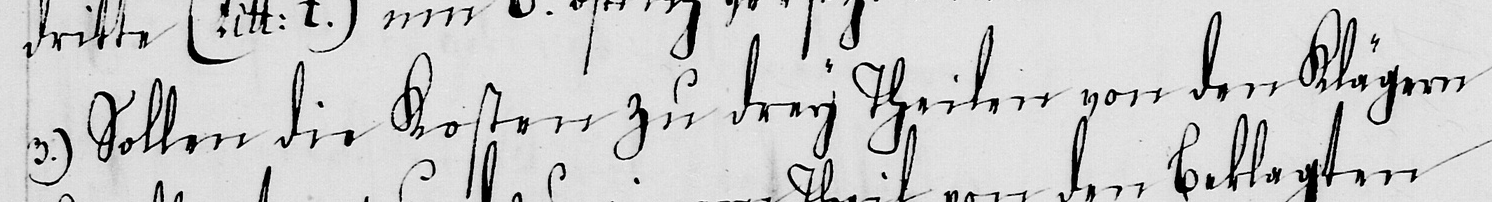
3.) Sollen die Kosten zu drey Theilen von den Klägern
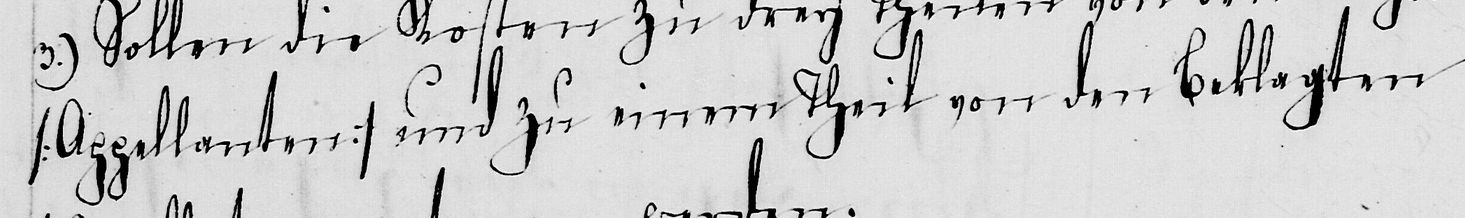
[Appellaten] und zu einem Theil von den Beklagten
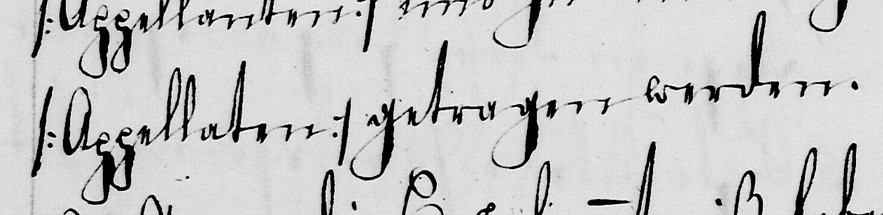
[Appellaten] getragen werden.
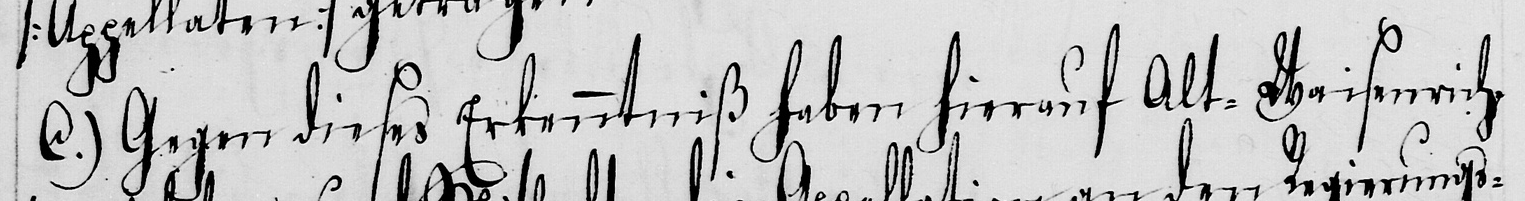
C.) Gegen dieses Erkenntniß haben hierauf Alt-Waisenrich¬
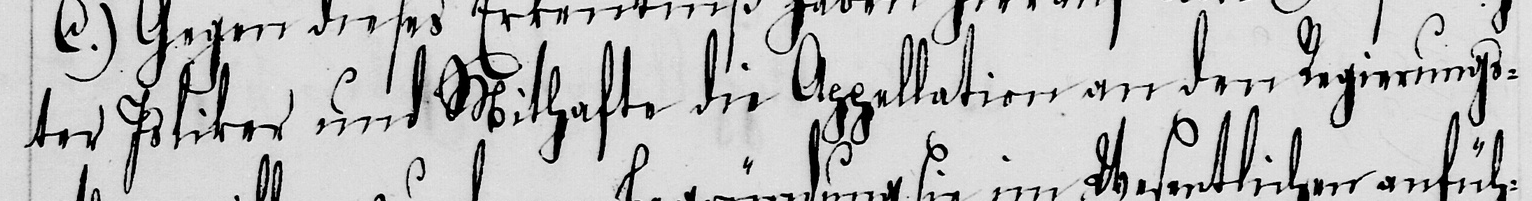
ter Isliker und Mithafte die Appellation an den Regierungs¬
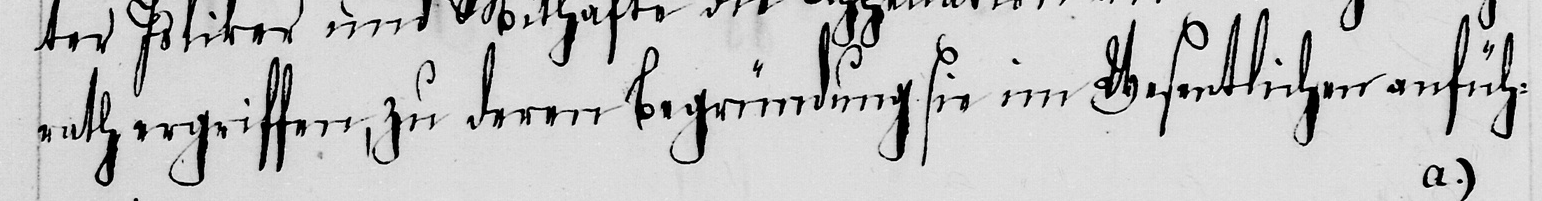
rath ergriffen, zu deren Begründung sie im Wesentlichen anfüh¬
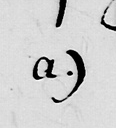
t.)
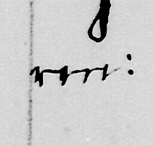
ren:
